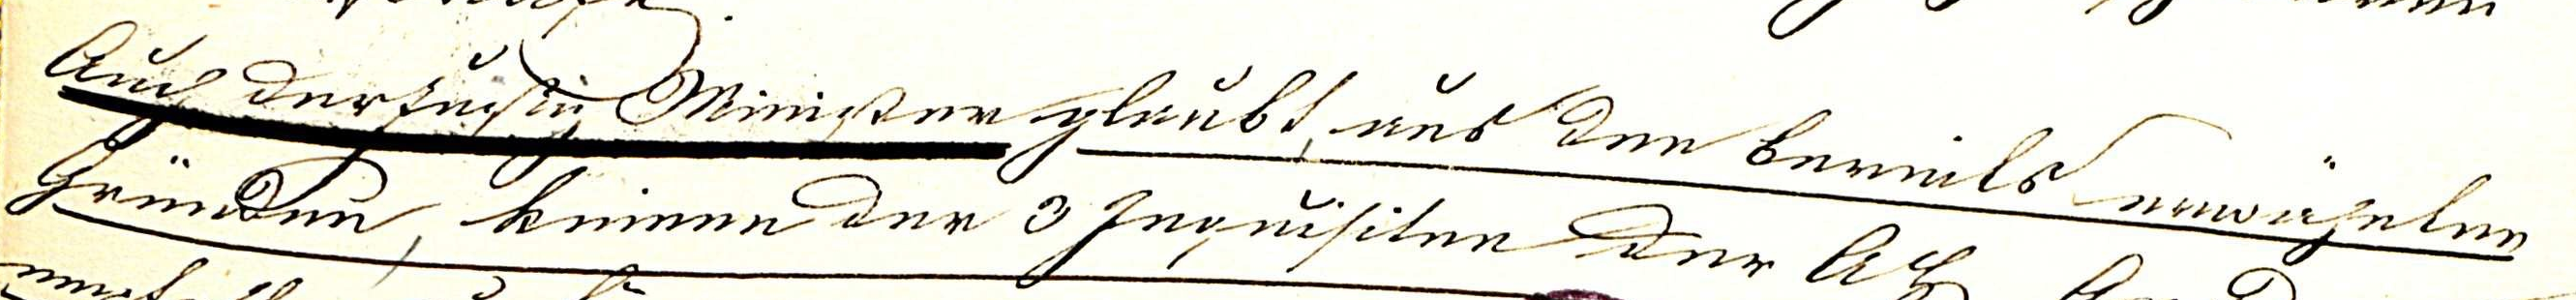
Auch der Justiz Minister glaubt, aus der bereits erwähnten
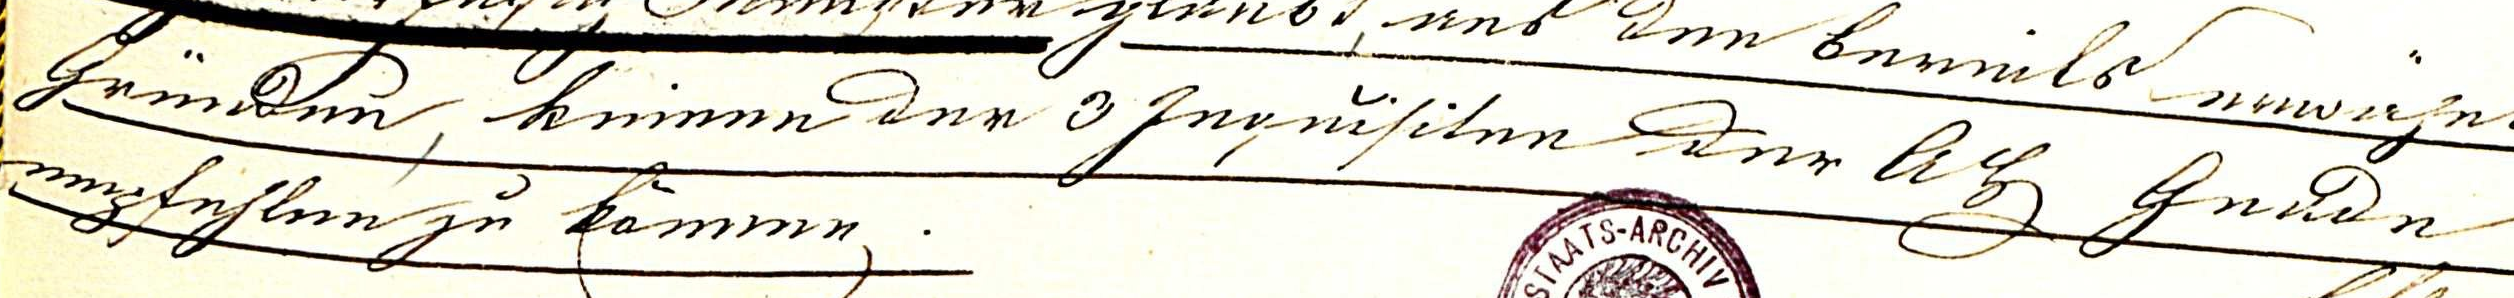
Gründen, keinen der 3 Inquisiten der AH Gnade
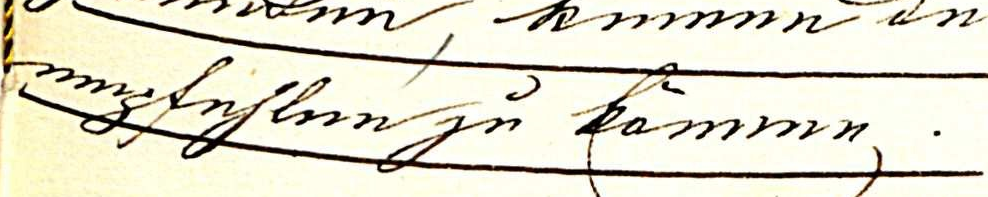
empfehlen zu können.
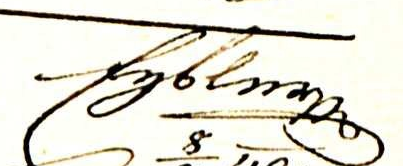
Eybler
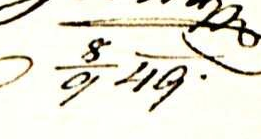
8/9 49
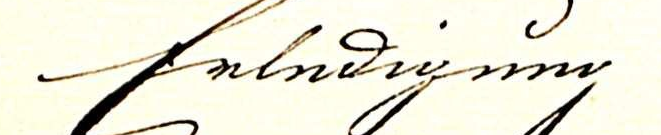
Erledigung
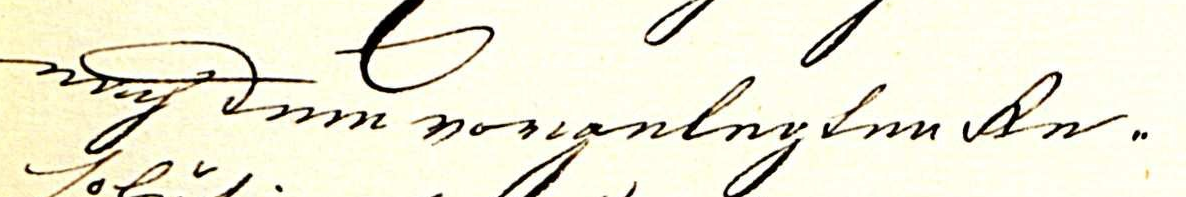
Nach dem vorgelegten Re¬
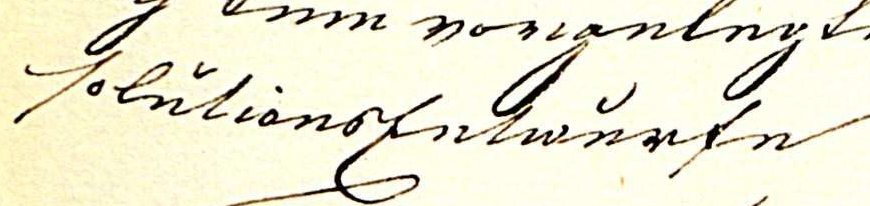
solutions Entwurfe
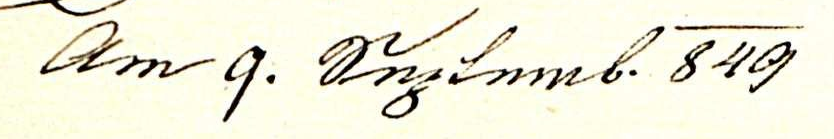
Am 9. Septemb. 849
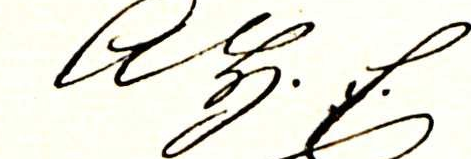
Ah E
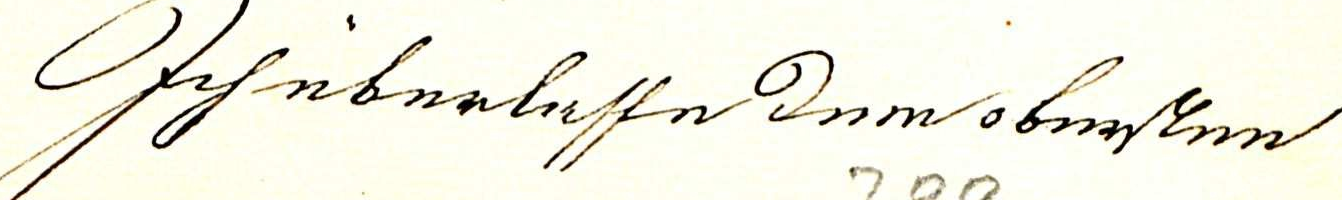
Ich überlasse dem obersten
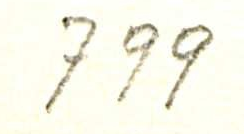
799
